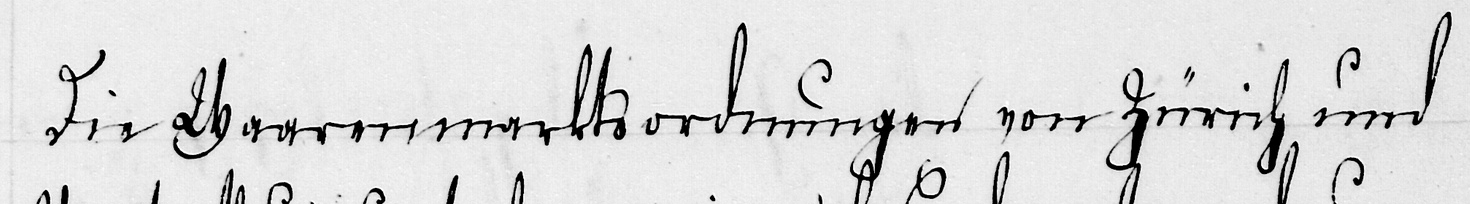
Die Waarenmarktsordnungen von Zürich und
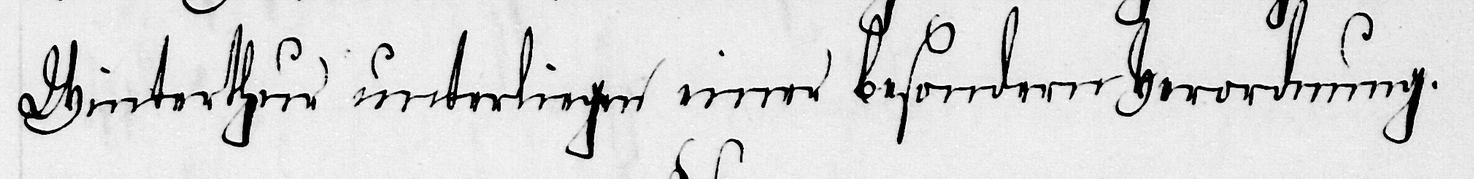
Winterthur unterliegen einer besondern Verordnung.
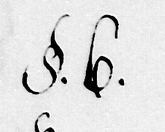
§. 6.
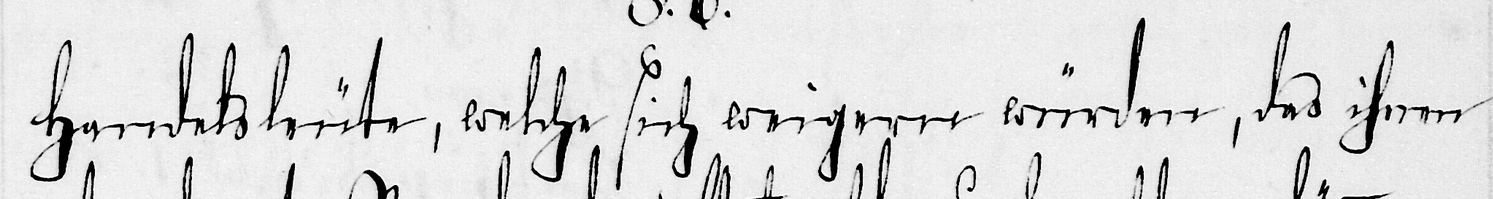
Handelsleute, welche sich weigern würden, das ihnen
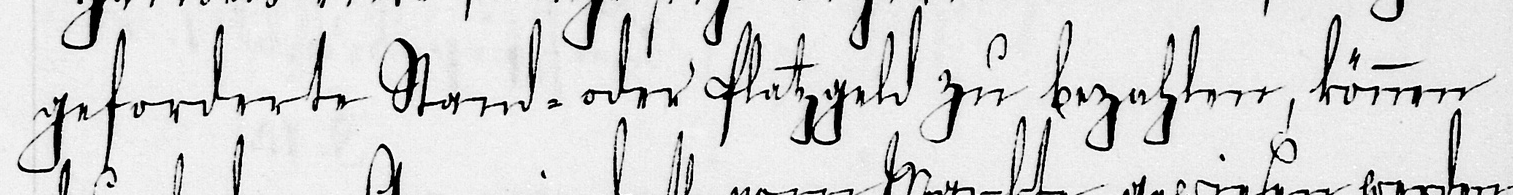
geforderte Stand- oder Platzgeld zu bezahlen, können
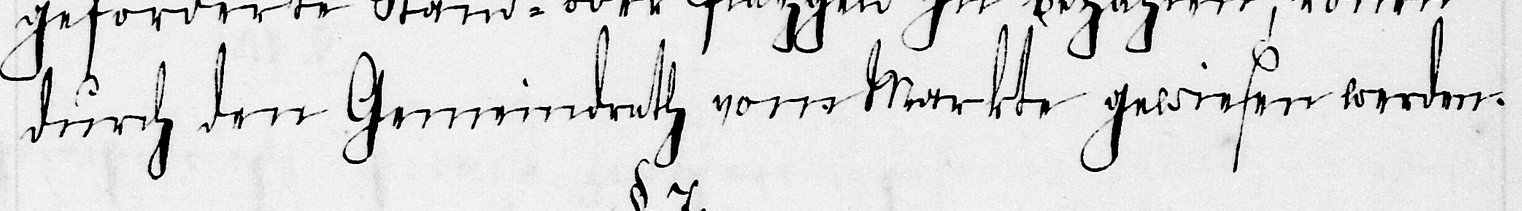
durch den Gemeindrath vom Markte gewiesen werden.
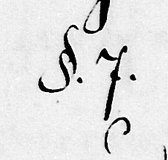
§. 7.
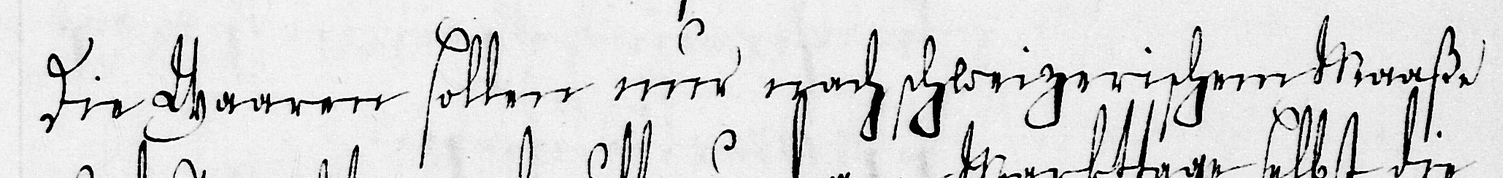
Die Waaren sollen nur nach schweizerischem Maaße
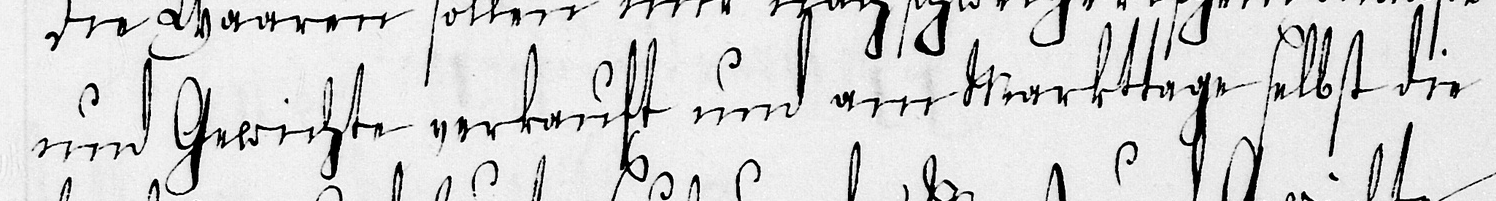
und Gewichte verkauft und am Markttage selbst die
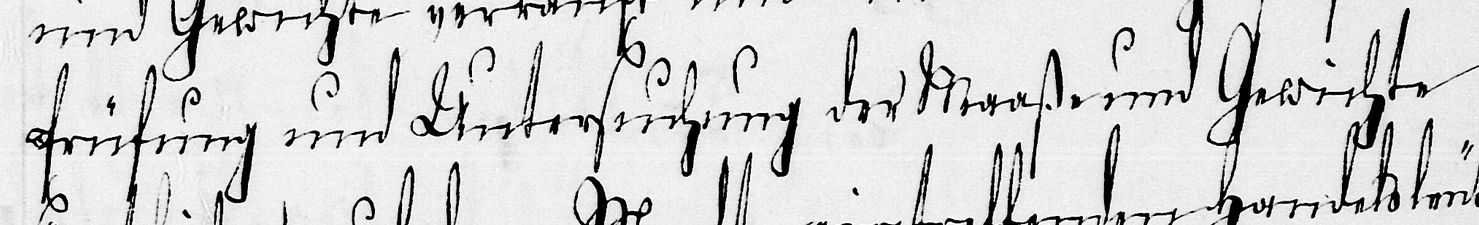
Prüfung und Untersuchung der Maaße und Gewichte
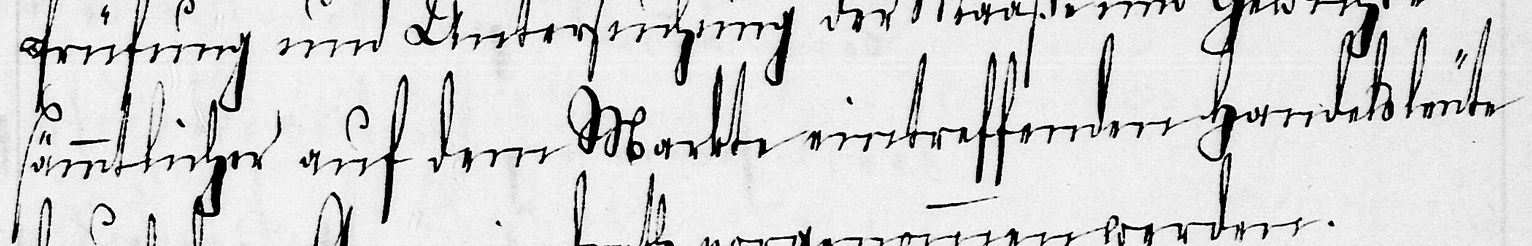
ämmtlicher auf dem Markte eintreffenden Handelsleute
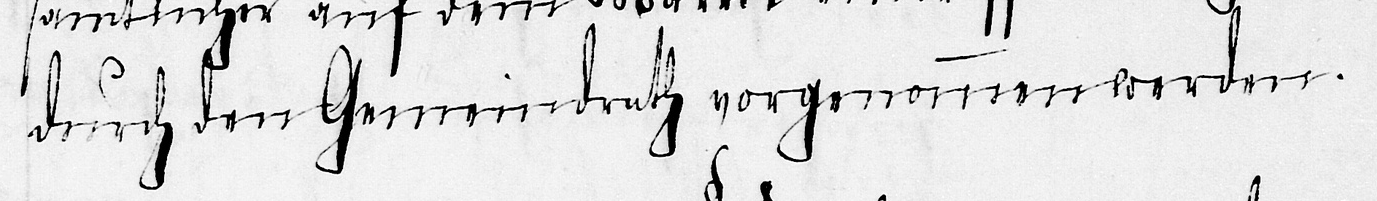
durch den Gemeindrath vorgenommen werden.
